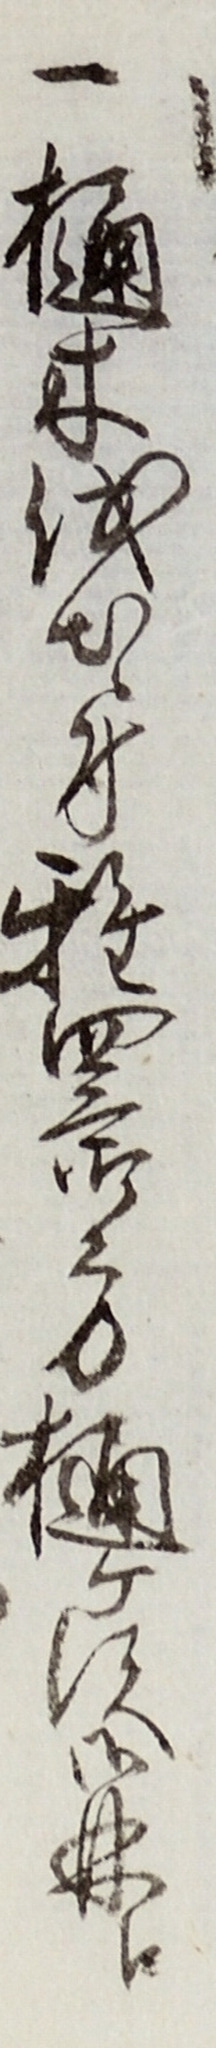一樋木伐出候付雅四郎方樋ケ沢御林江
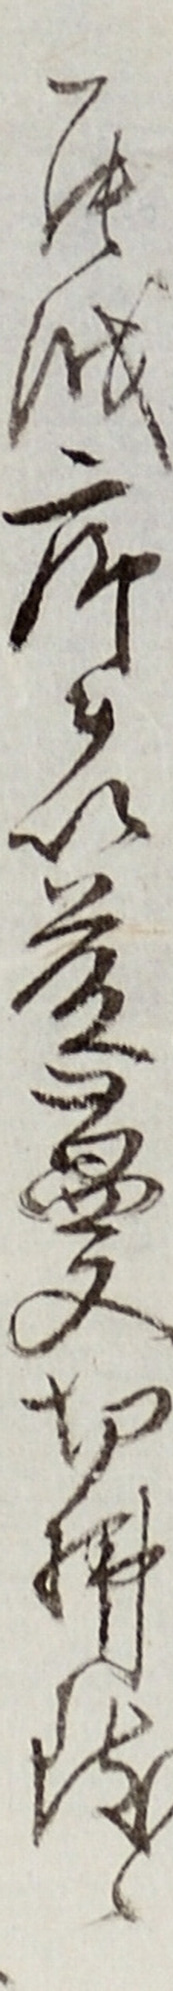罷越序ヲ以藤蔓切払致候
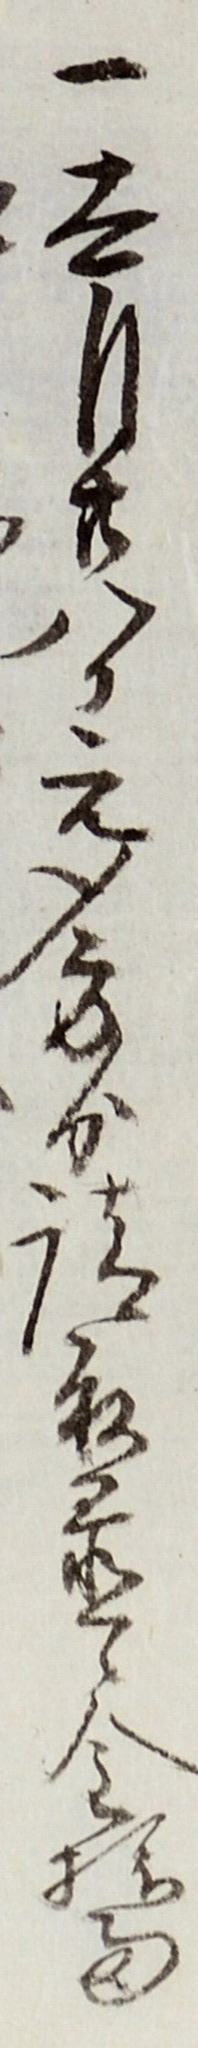一去月廿八日元〆方ゟ請取置候金拾両
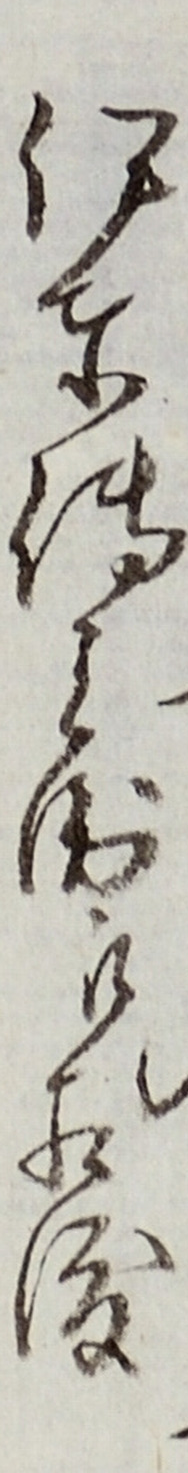伊東伝兵衛江相渡
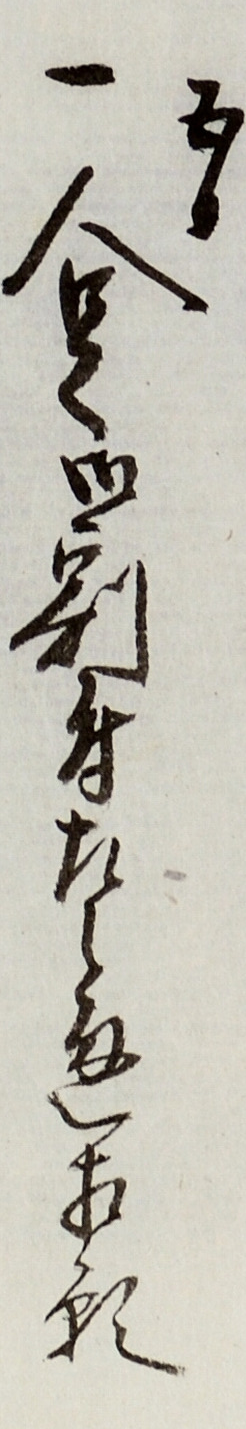一人足御割付左之通相願
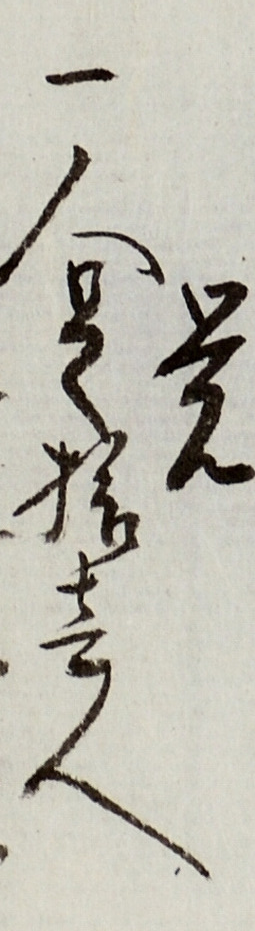一人足拾壱人
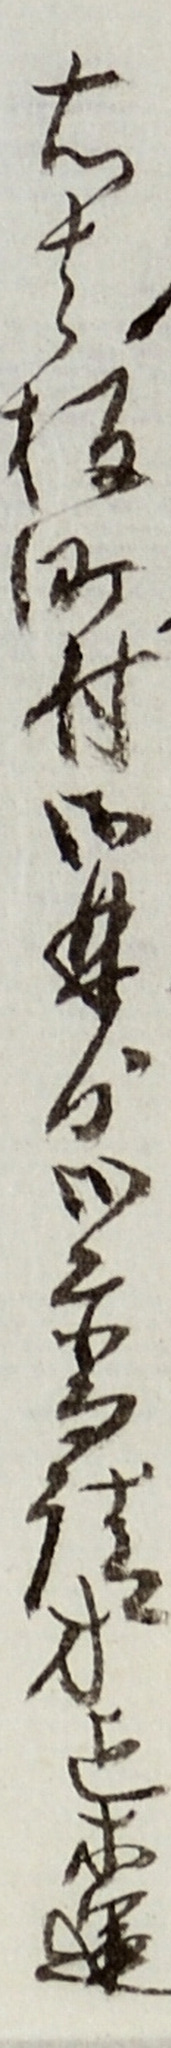右者板町村御林ゟ御普請方迄木運
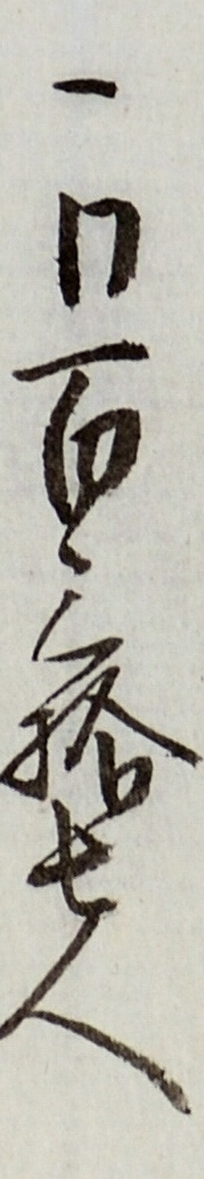一同百三拾七人
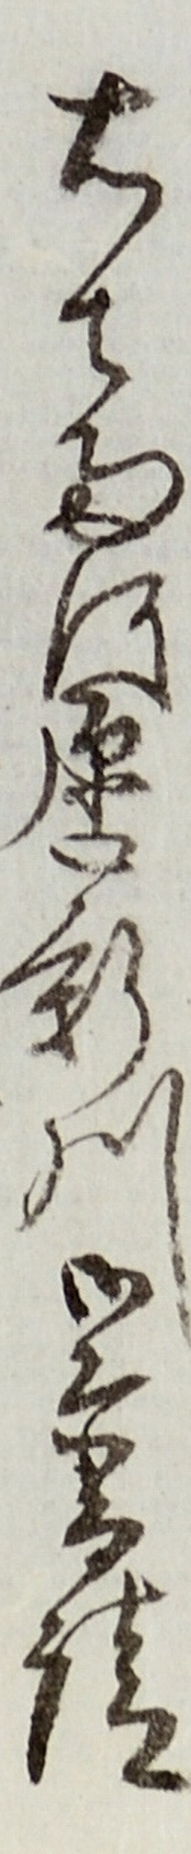右者両河原薪川御普請
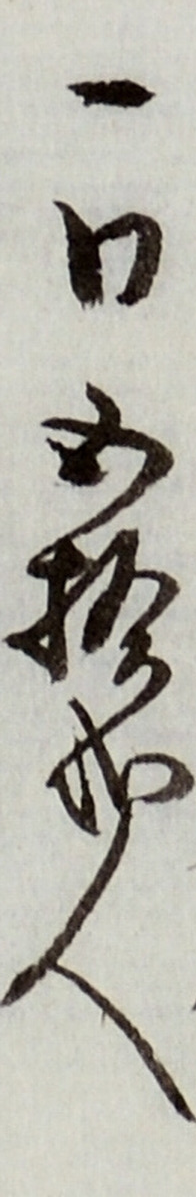一同五拾弐人
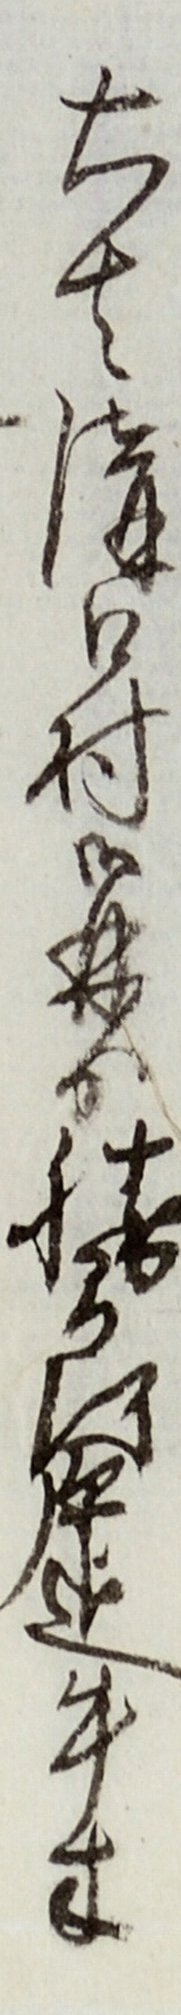右者溝口村御林ゟ勝間河原迄牛木
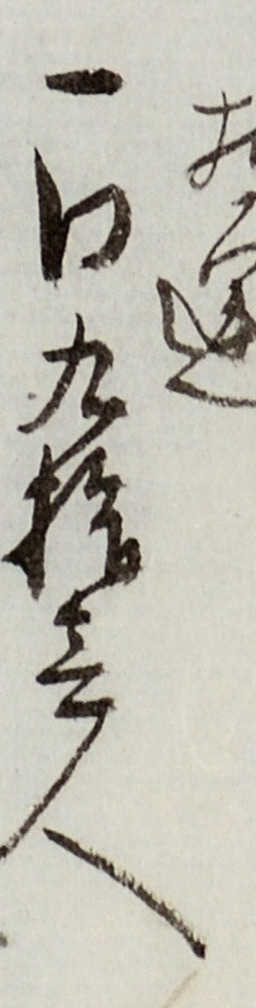一同九拾壱人
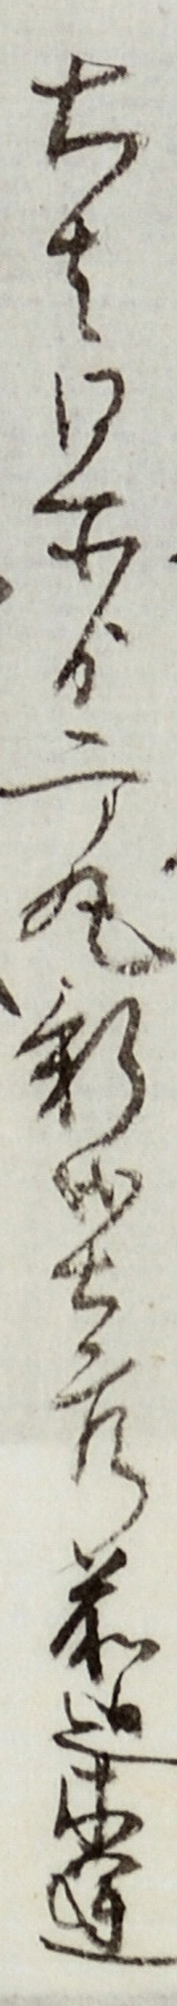右者同所ゟ二ノ丸新御土蔵前迄木運
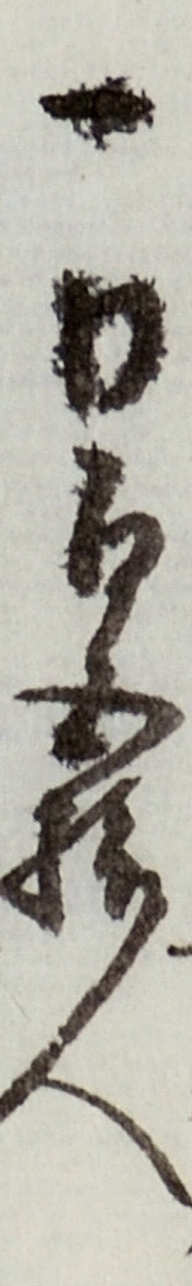一同百五拾人
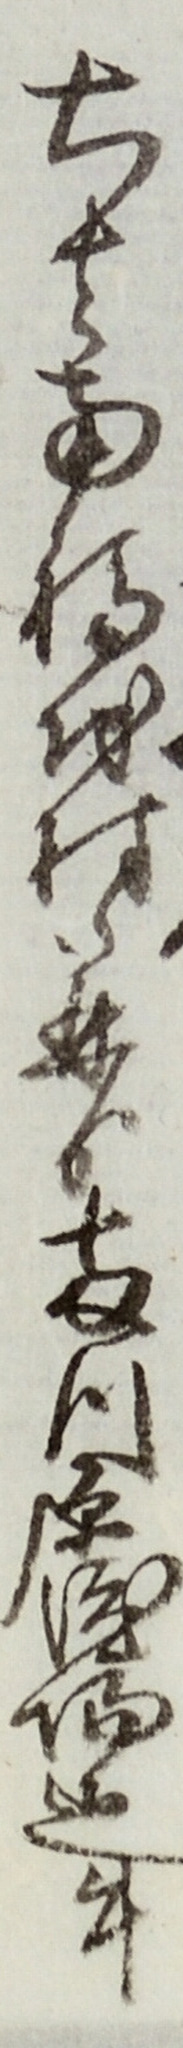右者南福地村御林ゟ両川原渡場迄牛
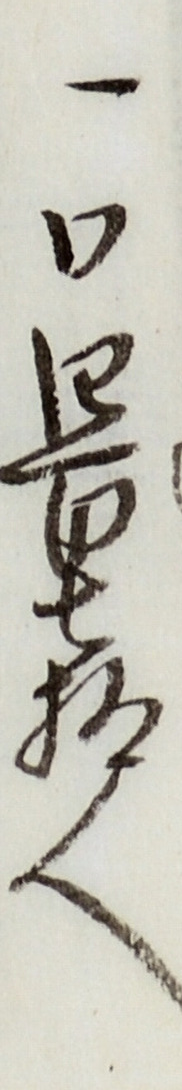一同四百七拾人
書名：御山方御薪方諸事御用留
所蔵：伊那市立高遠町図書館・合同会社AMANE
